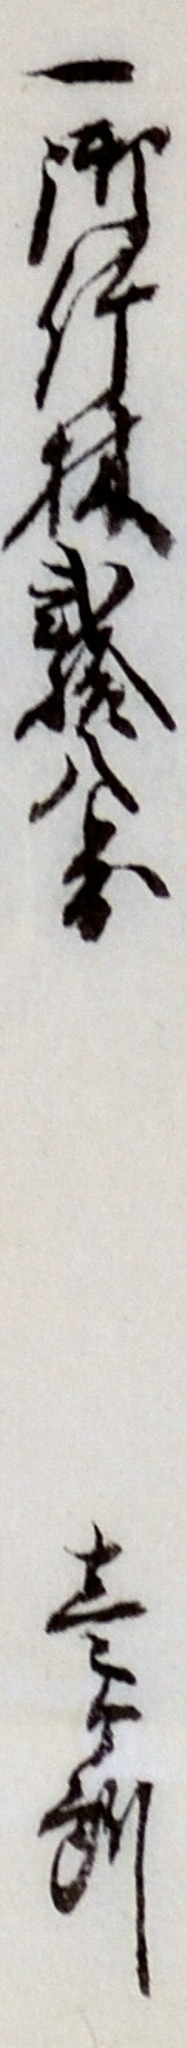一御竹林弐拾八歩壱ヶ所
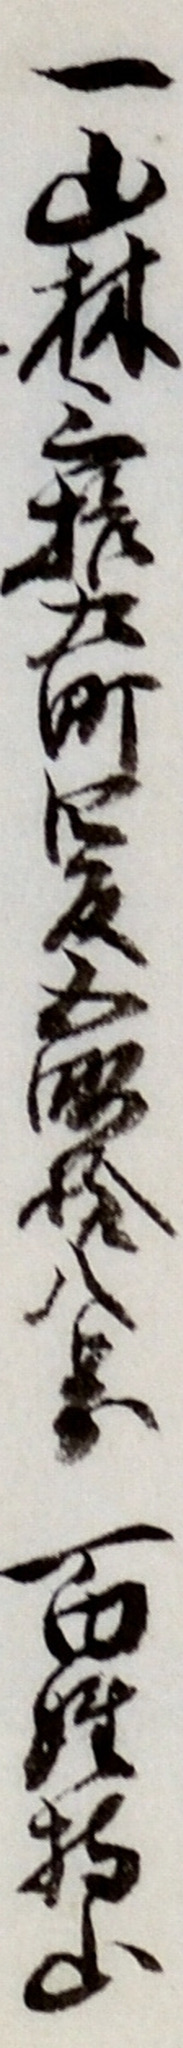一山林三拾九町四反五畝拾八歩百姓持山
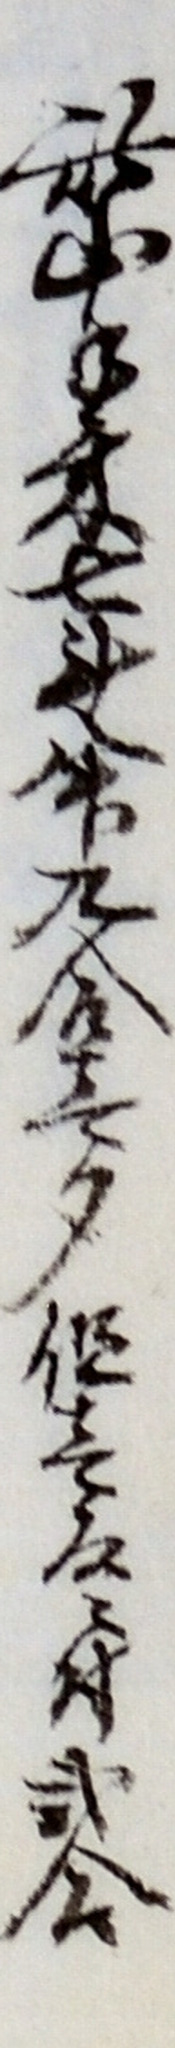此山手米七斗八升九合壱勺但壱反ニ付弐合

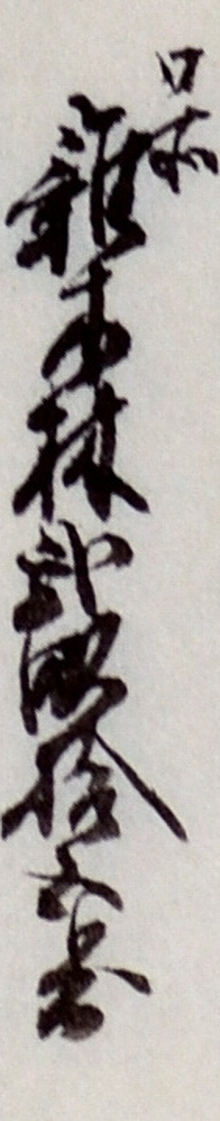雑木林弐畝拾五歩同院
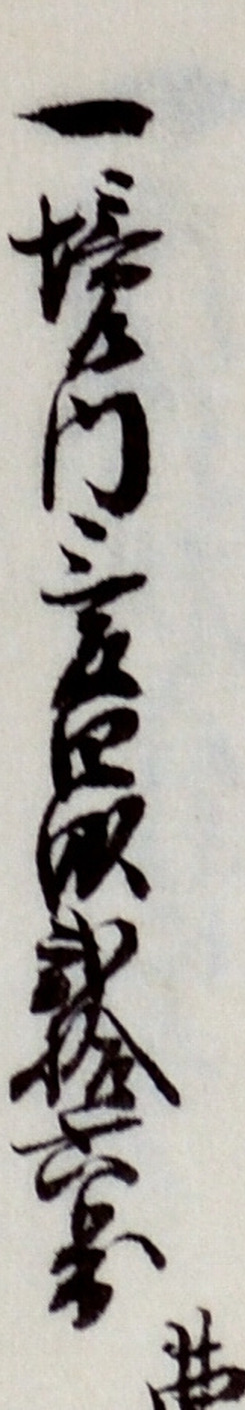一境内三反四畝弐拾六歩桃源院
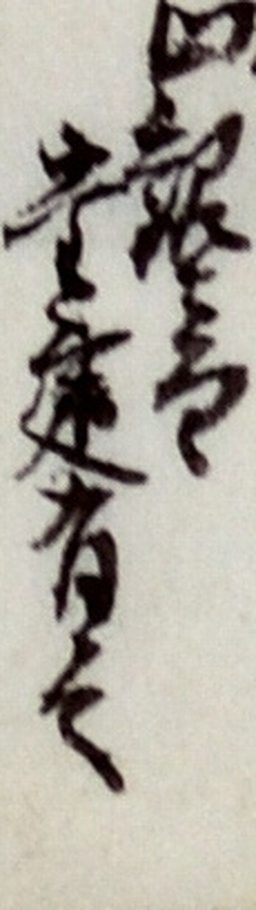宮建有之
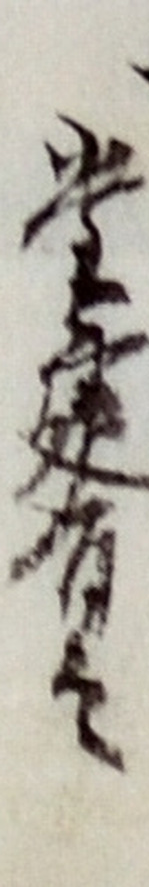堂建有之

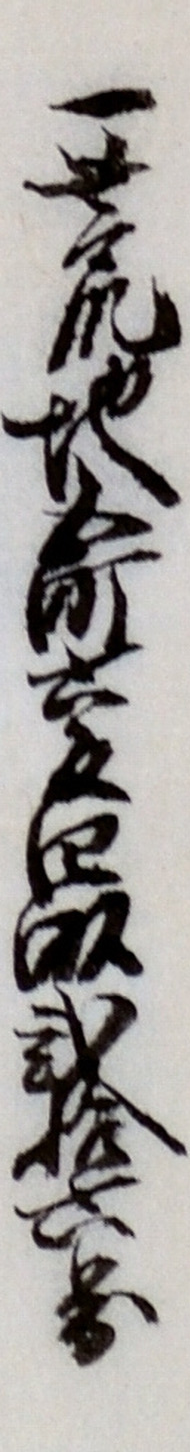一荒地五町六反四畝弐拾六歩村中
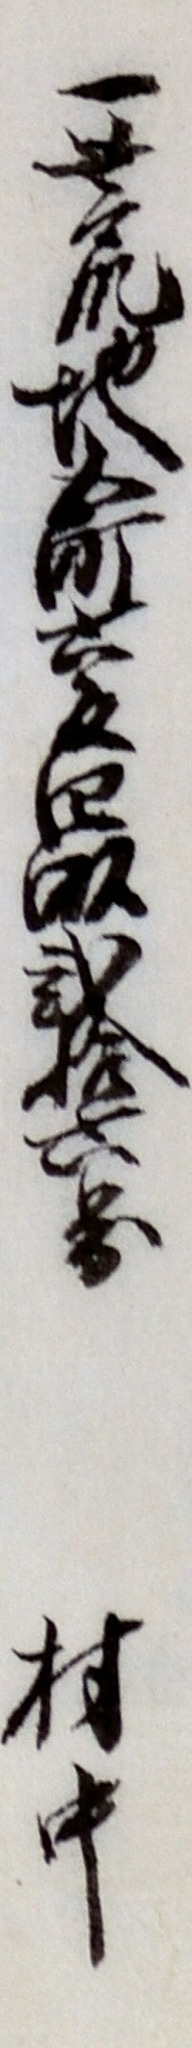一荒地五町六反四畝弐拾六歩村中
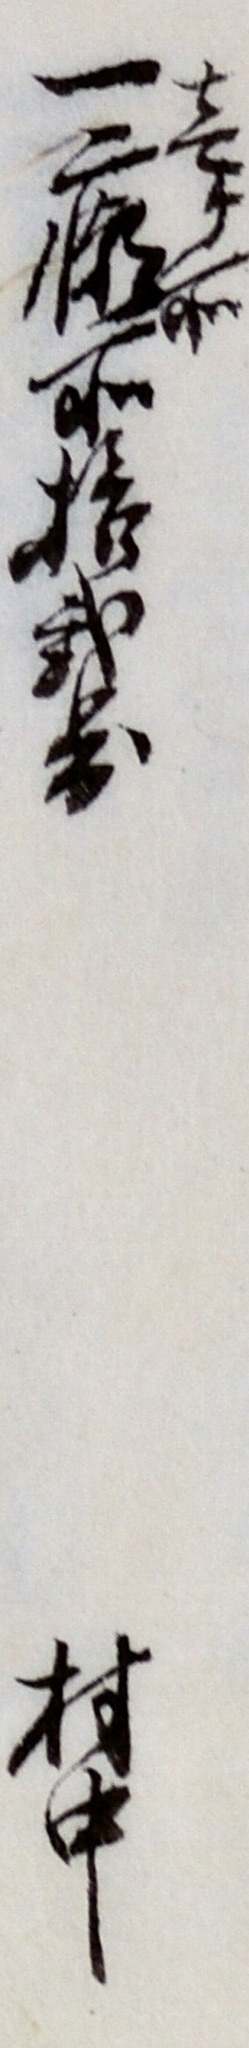一廟所拾弐歩村中
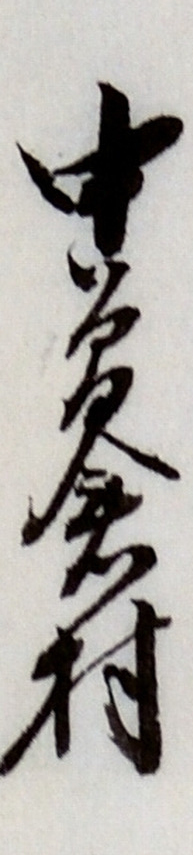中曾倉村
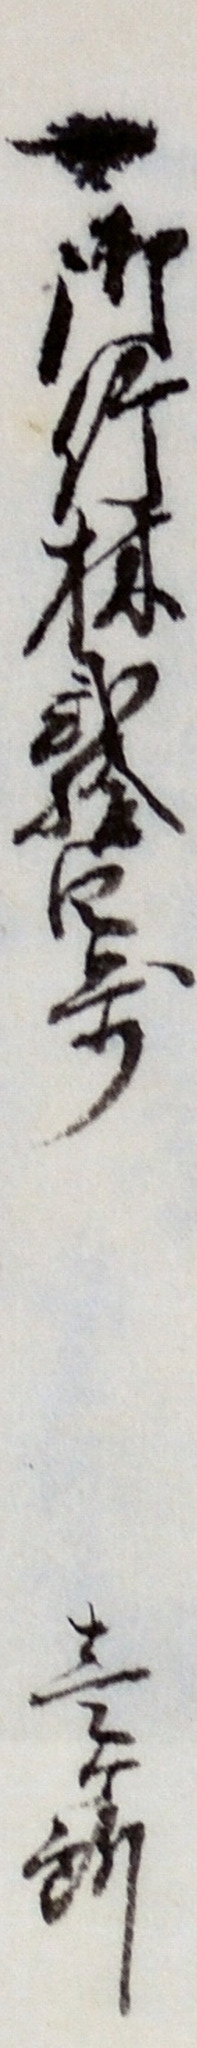一御竹林弐拾四歩壱ヶ所
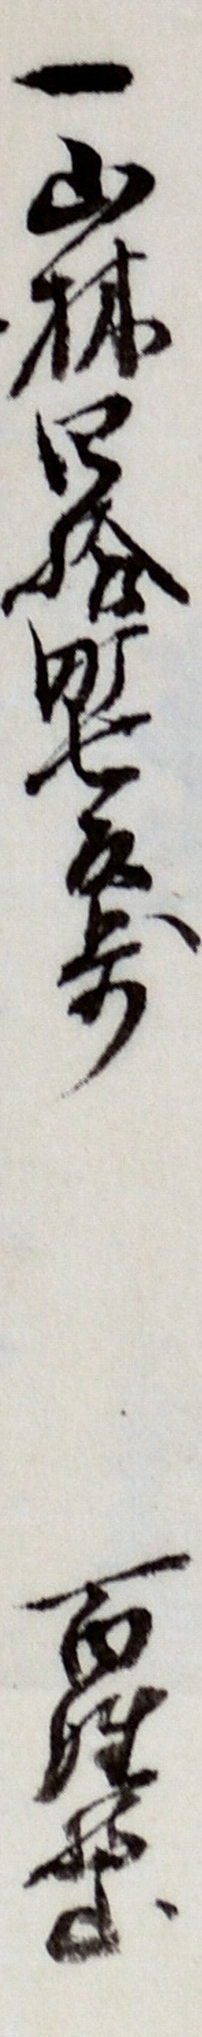一山林四拾町七反歩百姓持山
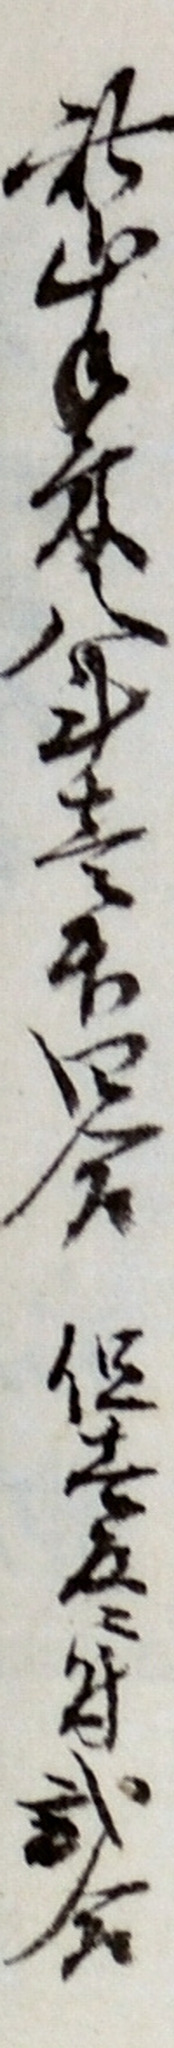此山手米八斗壱升四合但壱反ニ付弐合

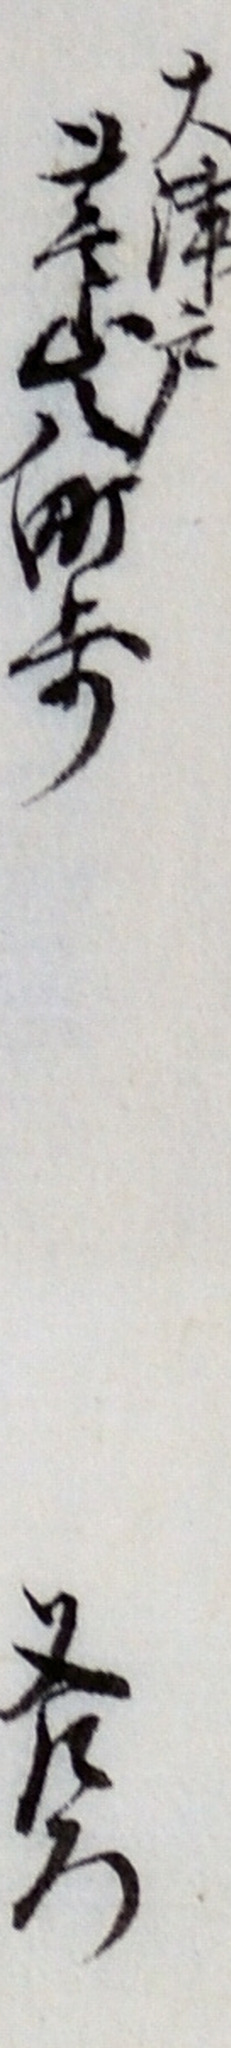芝山八町歩又左衛門
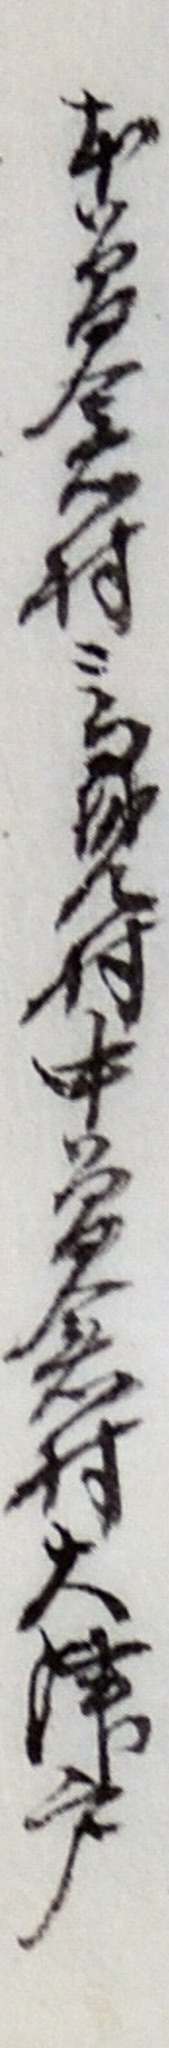本曾倉村高見村中曾倉村大津戸
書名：御領分中山林社地手控
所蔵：伊那市立高遠町図書館・合同会社AMANE
